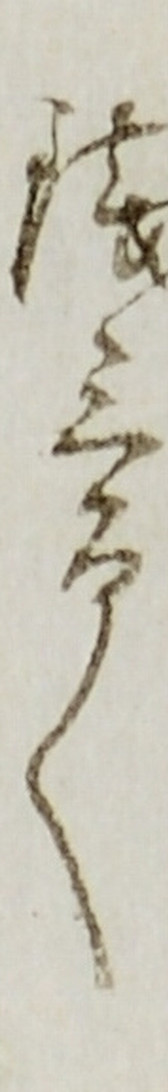銭三百文
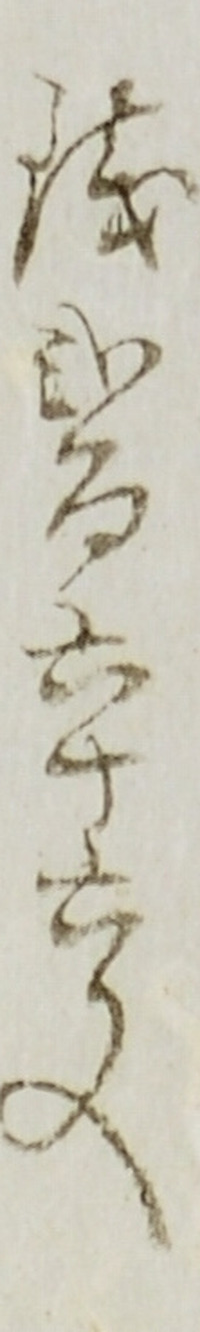銭弐百六十六文
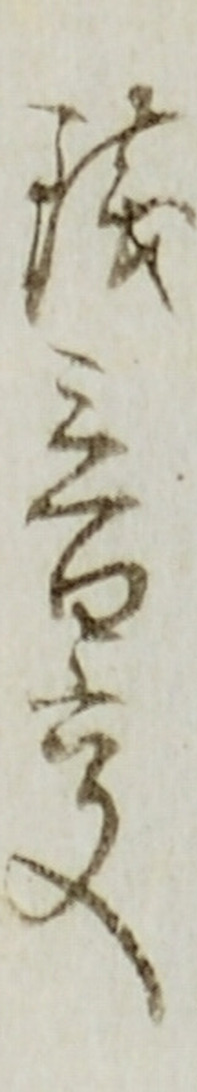銭三百文
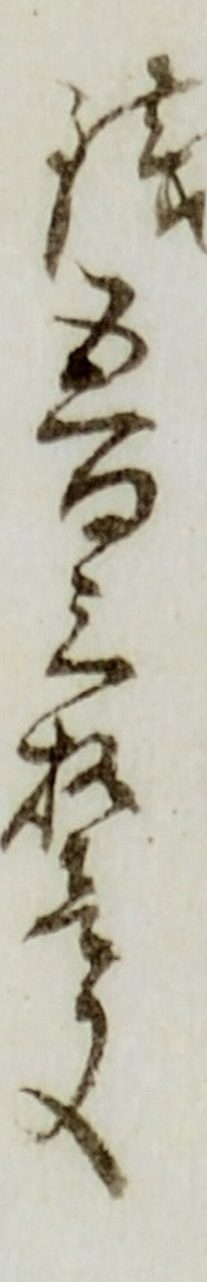銭五百三拾壱文
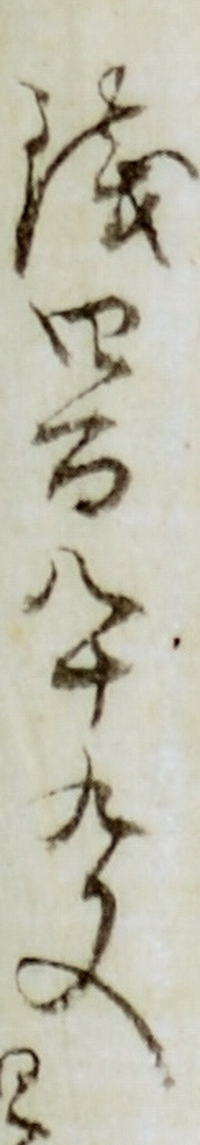銭四百八十九文
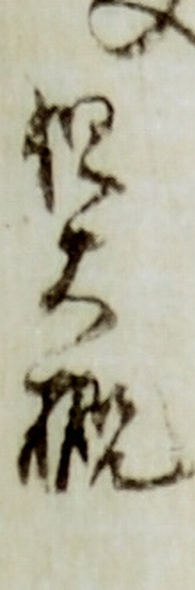但大概

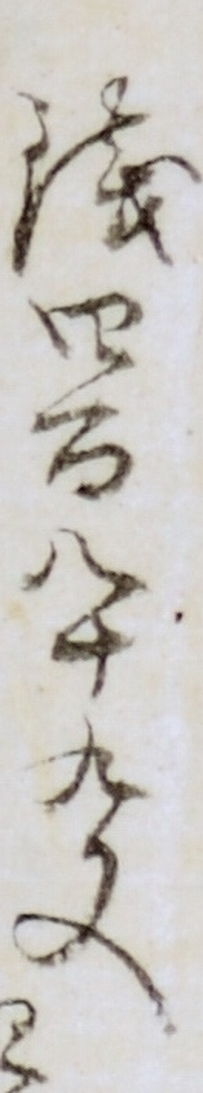銭四百二拾九文
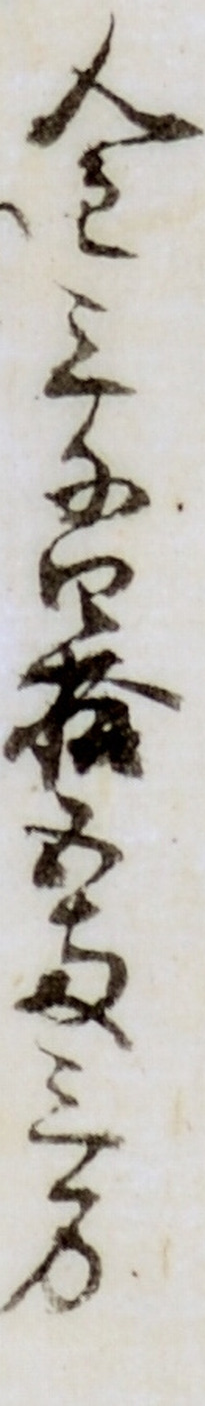〆金三千四拾五両三分
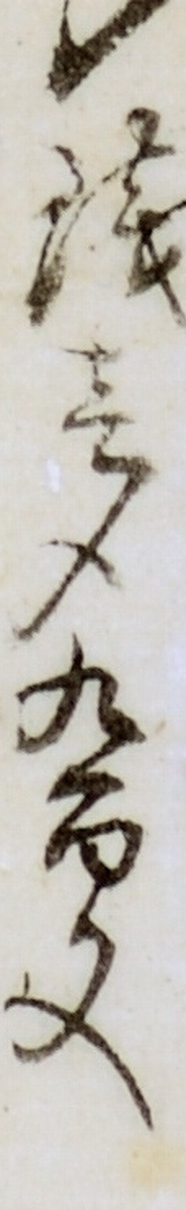銭壱貫九百文
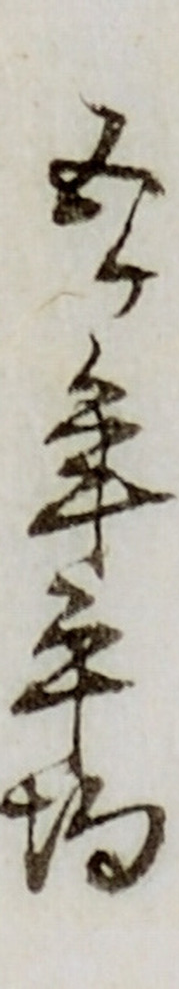五ヶ年平均
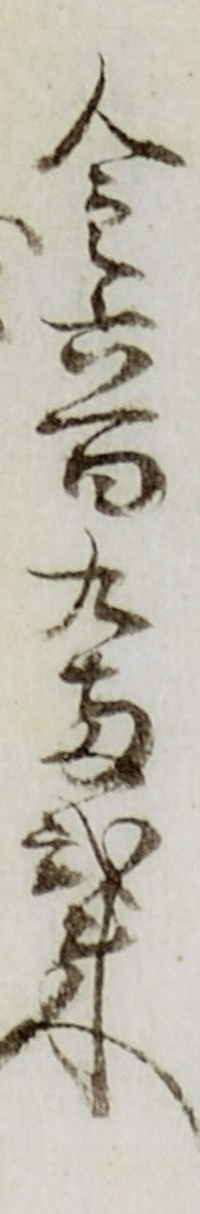金六百九両弐朱
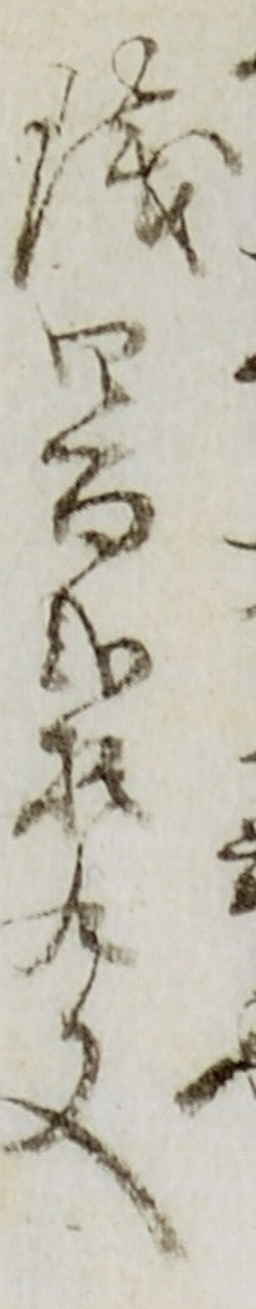銭四百二拾九文
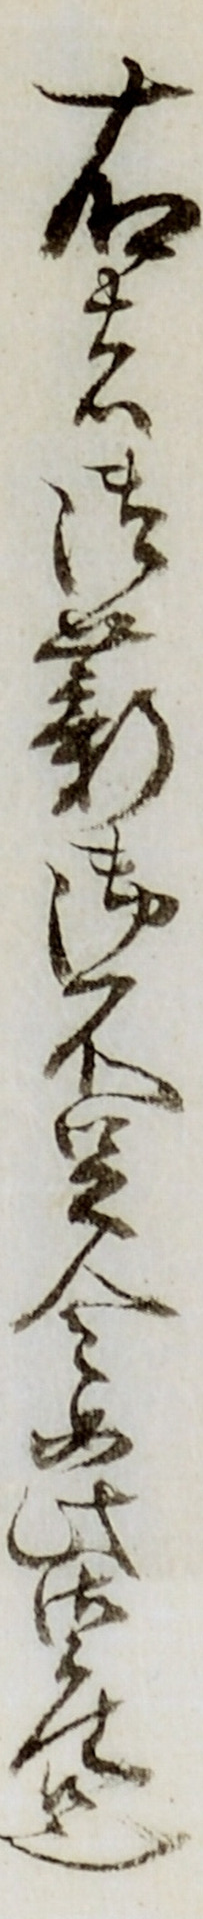右は御薪御不足金如此御座候也
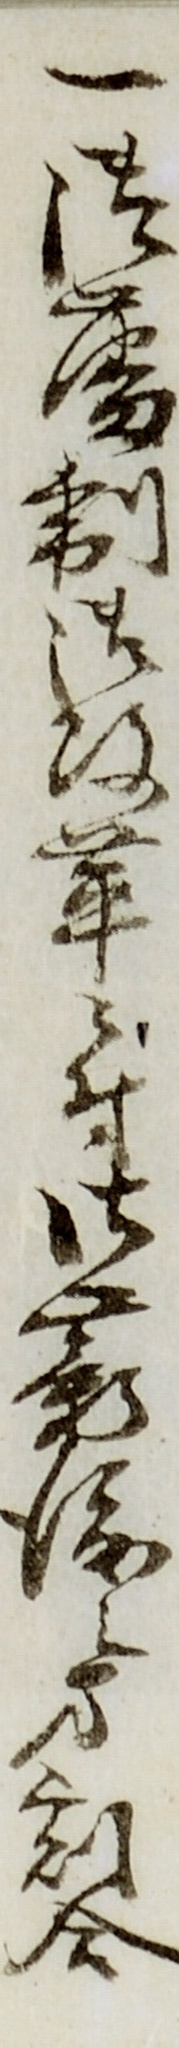一御藩制御改革に付御薪渡シ方割合
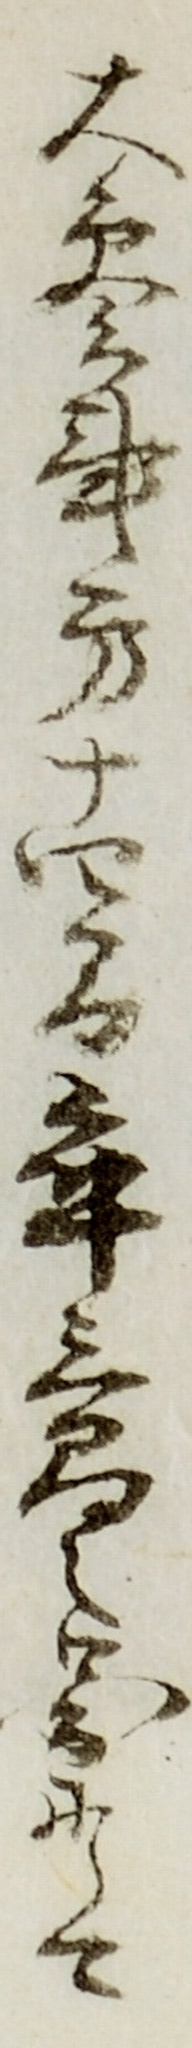大参事方十四間卒三間之図にして
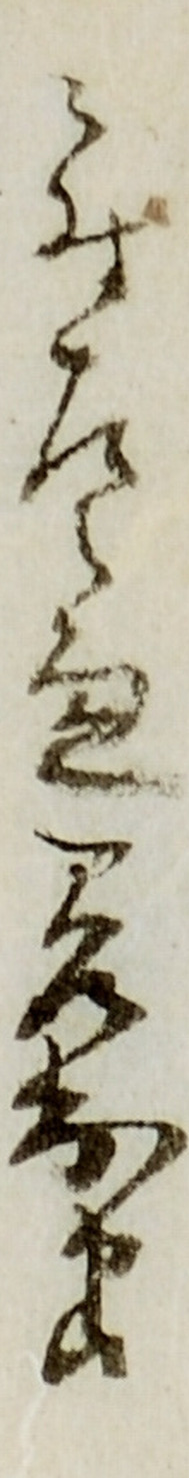に付左之通り差出申候
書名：山林方諸事御用留
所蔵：伊那市立高遠町図書館・合同会社AMANE
